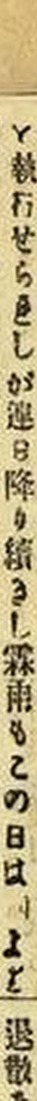を執行せられしが連日降り続きし霖雨もこの日はより
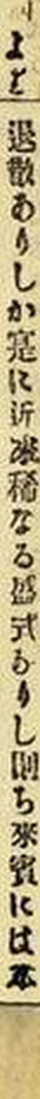退散ありしか寔に近来稀なる盛式なりし則ち来賓には本
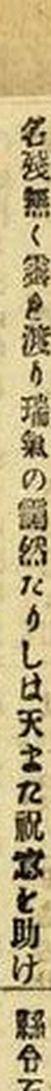名残無く晴れ渡り瑞気の靄然たりしは天また祝意を助け
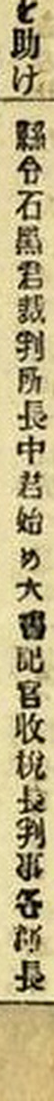県令石黒君裁判所長中君始め大書記官収税長判事各郡長
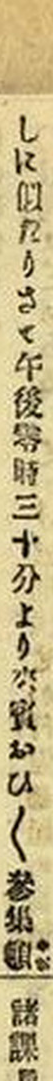しに似たりさて午後零時三十分より来賓おひ〳〵参集頓
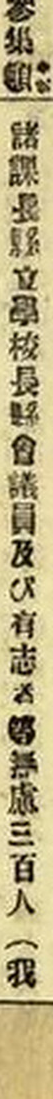諸課長県立学校長県会議員及び有志者等無慮三百人我
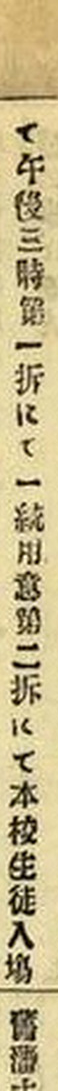て午後三時第一柝にて一統用意第二柝にて本校生徒入場
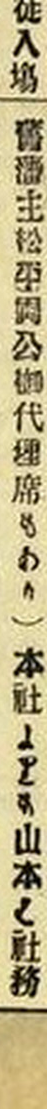旧藩主松平公御代理席もあり本社よりも山本は社務
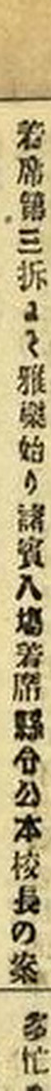着席第三柝にて雅楽始り諸賓入場着席県令公本校長の案
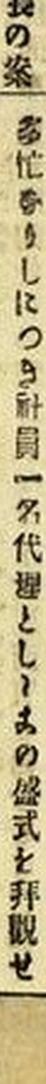多忙なりしにつき社員一名代理としてこの盛式を拝観せ
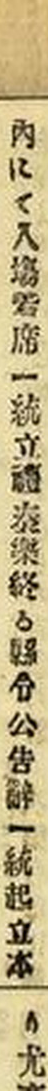内にて入場着席一統立礼奏楽終る県令公告辞一統起立本
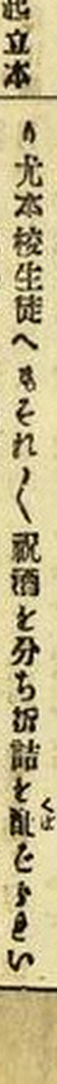り尤本校生徒へもそれ〳〵祝酒を分ち折詰を配ばられい
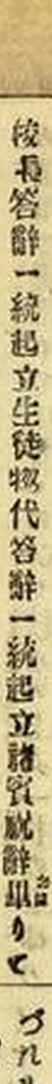校長答辞一統起立生徒惣代答辞一統起立諸賓祝辞畢りて
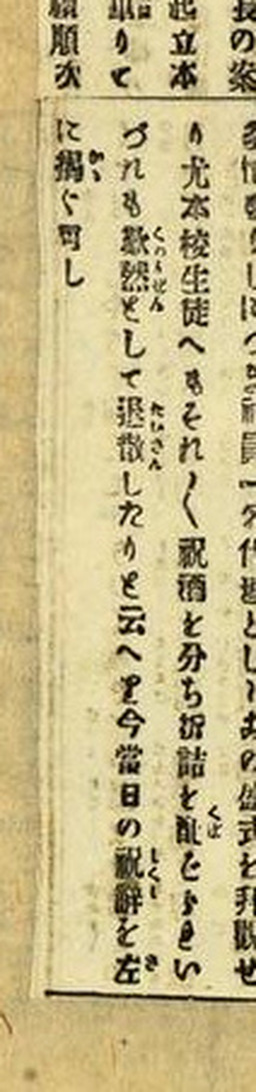づれも歓然として退散したりと云へり今当日の辞祝を左
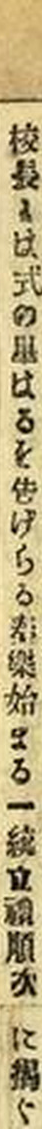校長には式の畢はるを告げらる奏楽始まる一統立礼順次

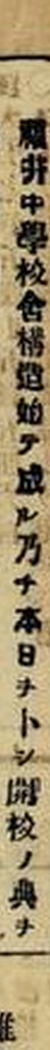福井中学校舎構造始テ成ル乃チ本日ヲ卜シ開校ノ典ヲ
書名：温古集 五巻
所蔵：福井県文書館 Fukui Prefectural Archives
